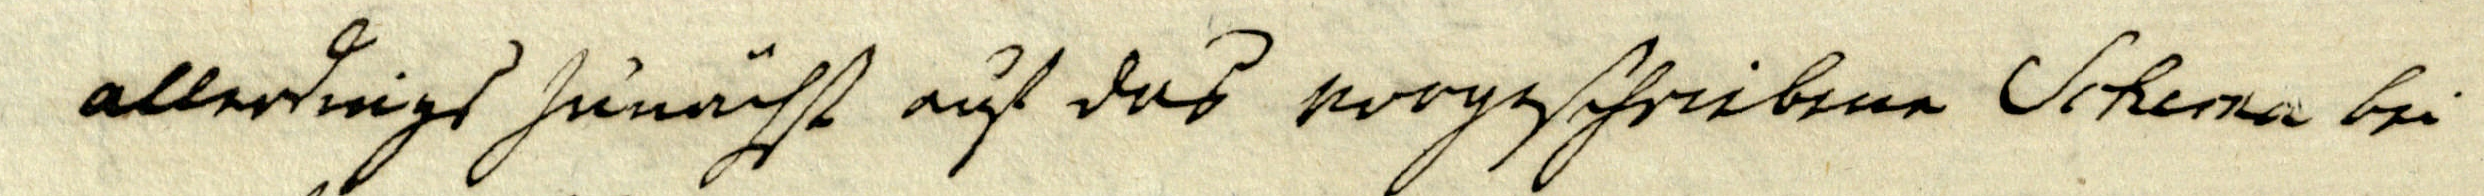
allerdings zunächst auf das vorgeschriebene Schema bei
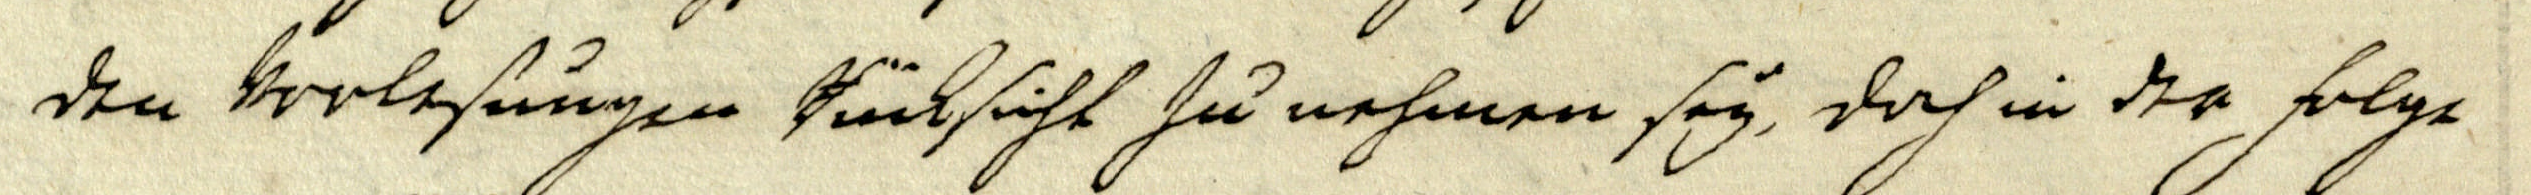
den Vorlesungen Rücksicht zu nehmen seÿ, doch in der Folge
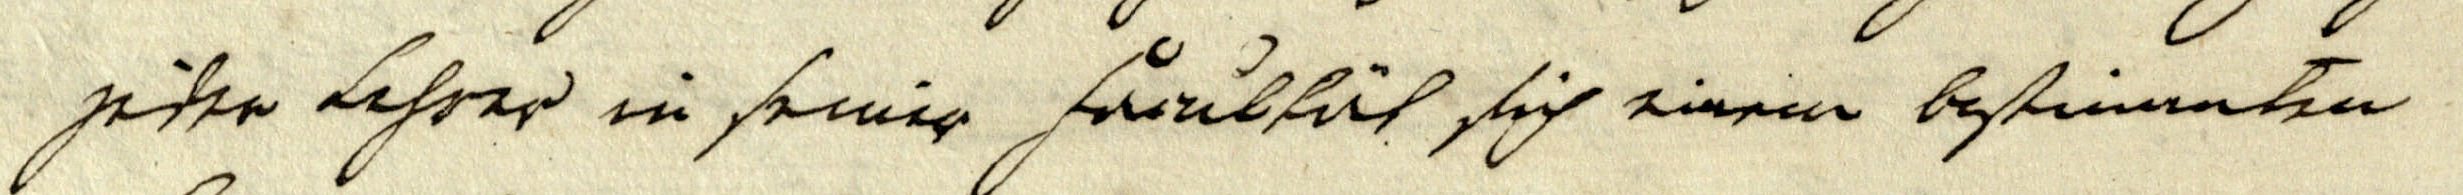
jeder Lehrer in seiner Facultät sich einem bestimmten
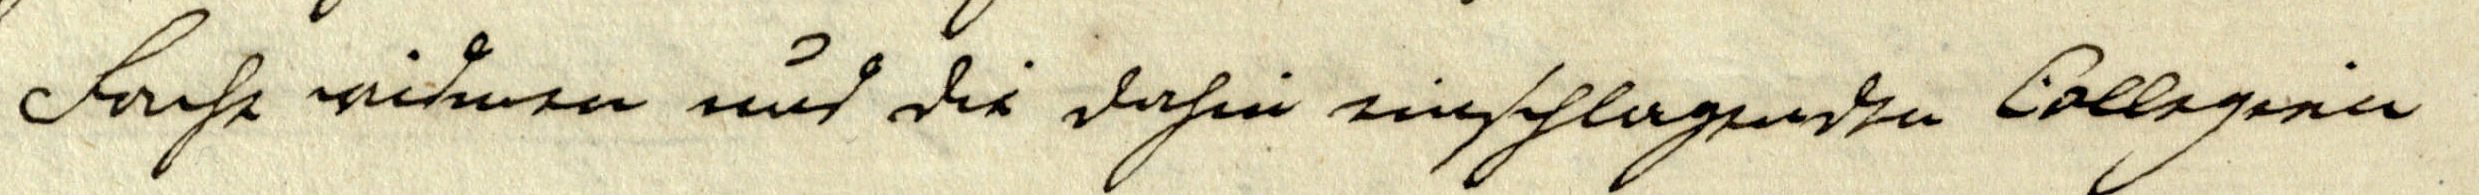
Fache widmen und die dahin einschlagenden Collegien
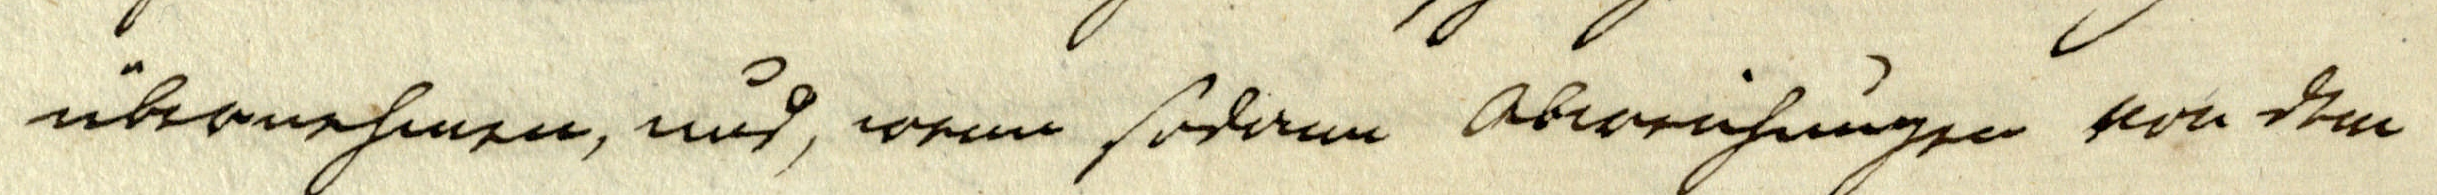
übernehmen, und, wenn sodann Abweichungen von dem
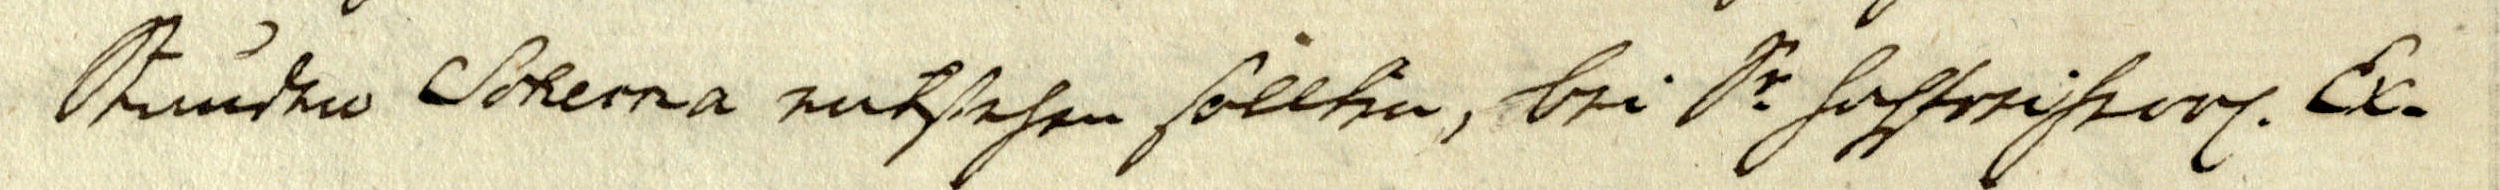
Stunden Schema entstehen sollten, bei Sr. hochfreiherrl. Ex¬
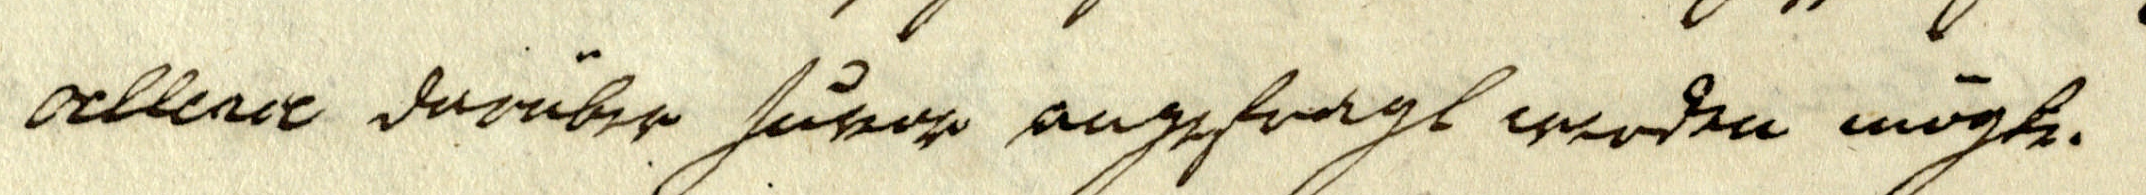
cellence darüber zuvor angefragt werden mögte.
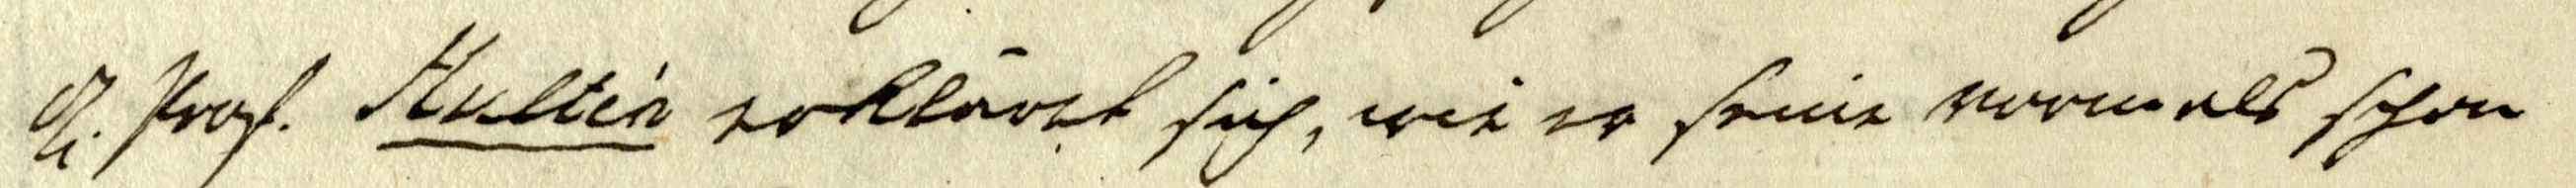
dh. Prof. Hultén erkläret sich, wie er seine vormals schon
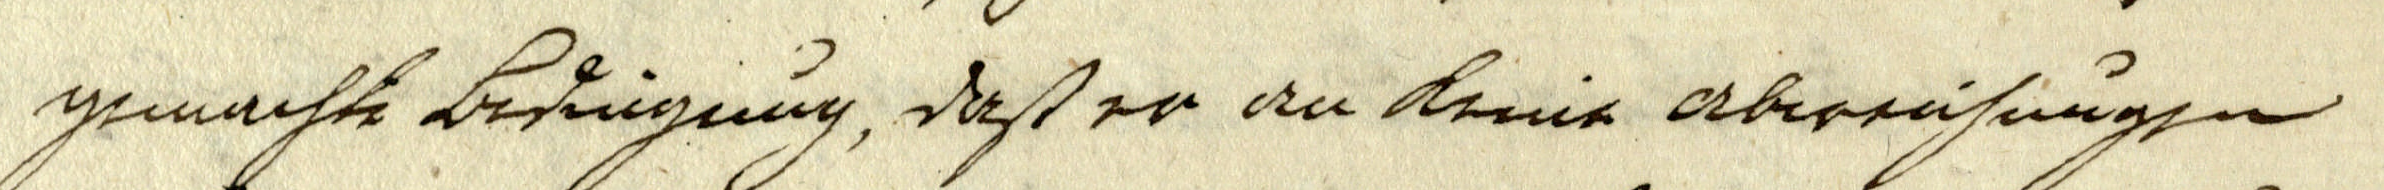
gemachte Bedingung, daß er an keine Abweichungen
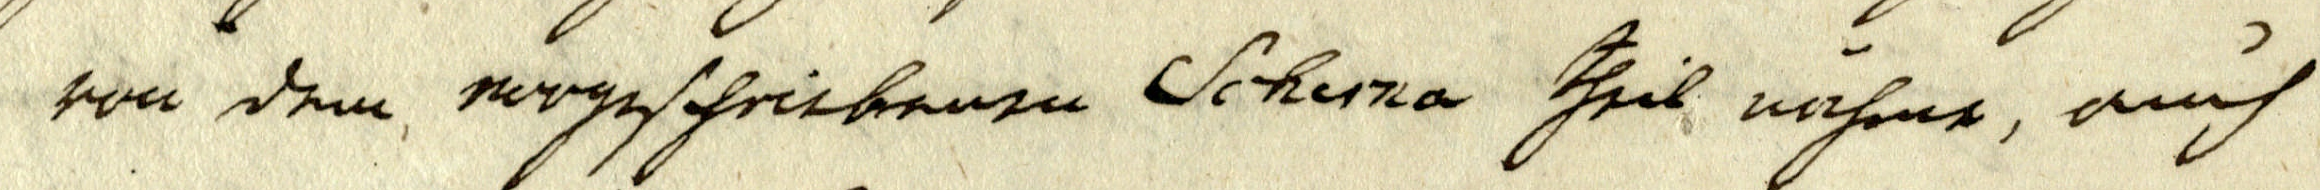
von dem vorgeschriebenen Schema theil nähme, auch
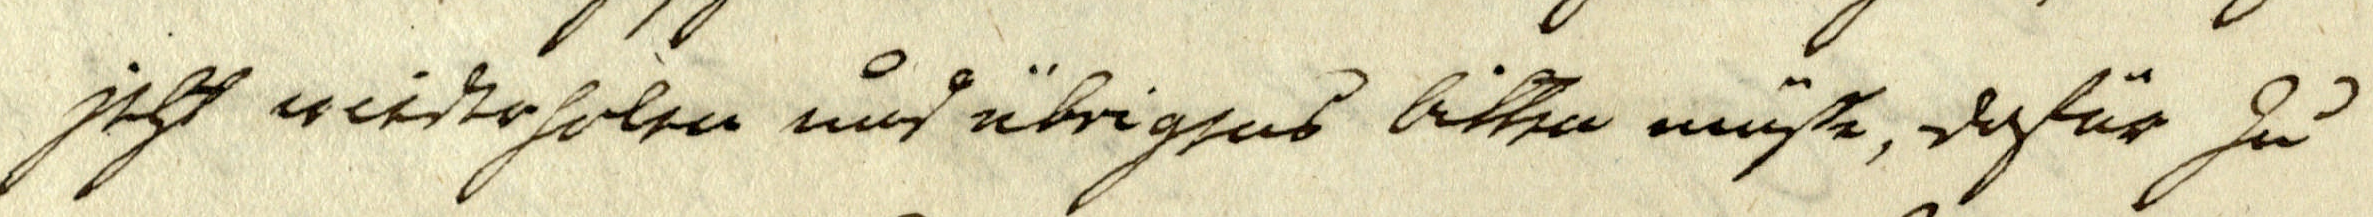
jetzt wiederholen und übrigens bitten müsse, dafür zu
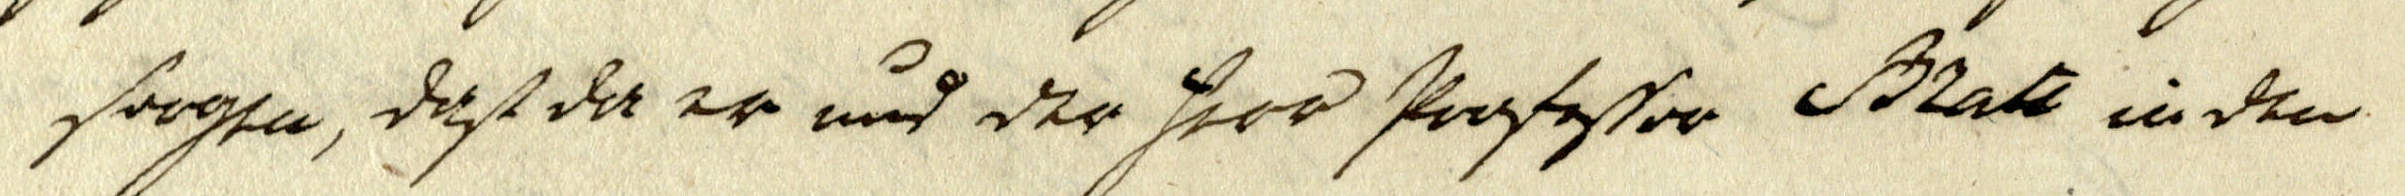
sorgen, daß da er und der herr Professor Bratt in den
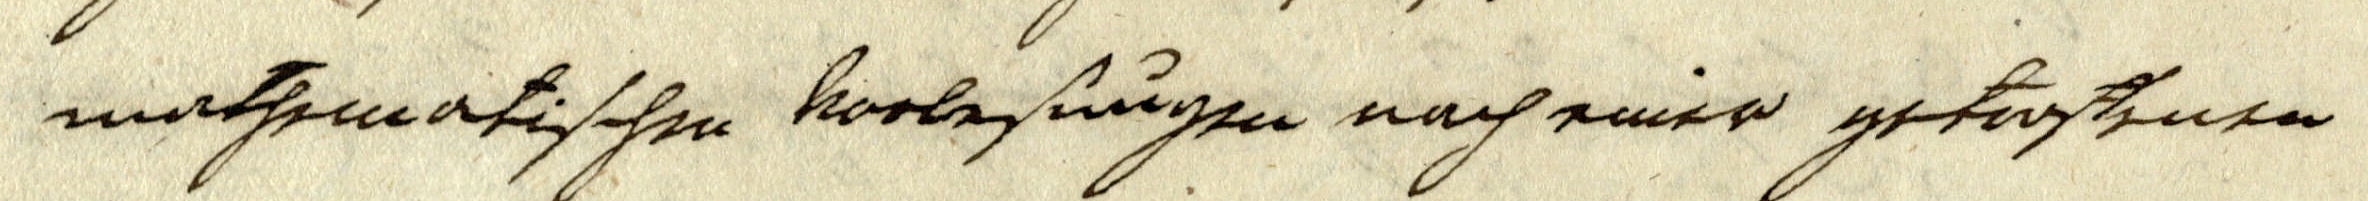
mathematischen Vorlesungen nach einer getroffenen
